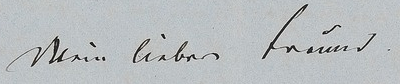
Mein lieber Freund.
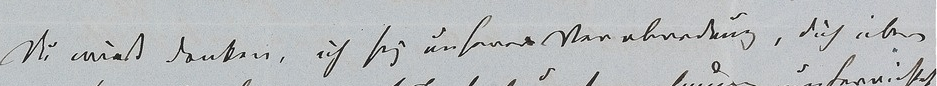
Du wirst denken, ich sey unserer Verabredung, dich über
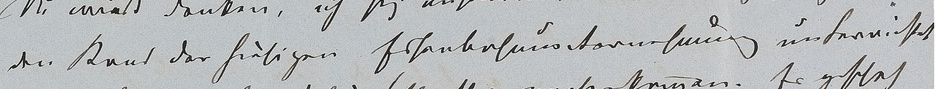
den Stand der hiesigen Eisenbahnunternehmung unterrichtet
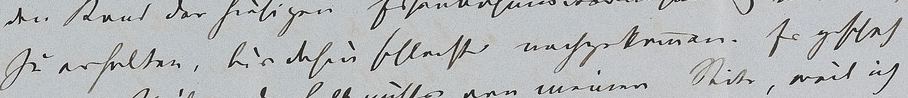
zu erhalten, bis dahin schlecht nachgekommen. Es geschah
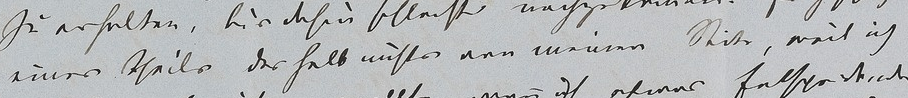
eines Theils deshalb nichts von meiner Seite, weil ich
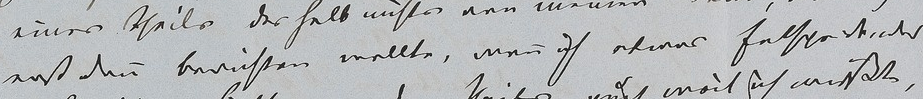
erst dann berichten wollte, wenn ich etwas Entscheidendes
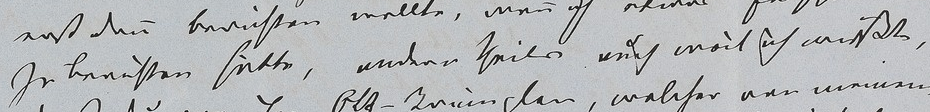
zu berichten hätte, andern Theils auch weil ich wußte,
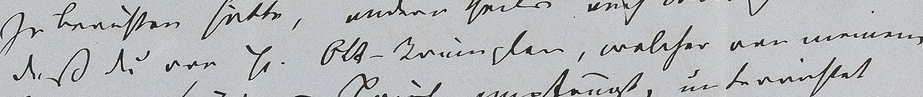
daß du von H. Ott-Trümpler, welcher von meinem
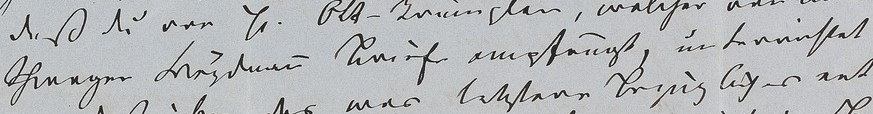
Schwager Weydmann Briefe empfängt, unterrichtet
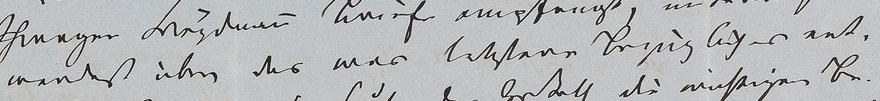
werdest über das was letztere Bezügliches ent-
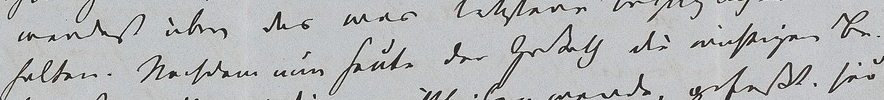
halten. Nachdem nun heute der Gr Rath die wichtigen Be-
